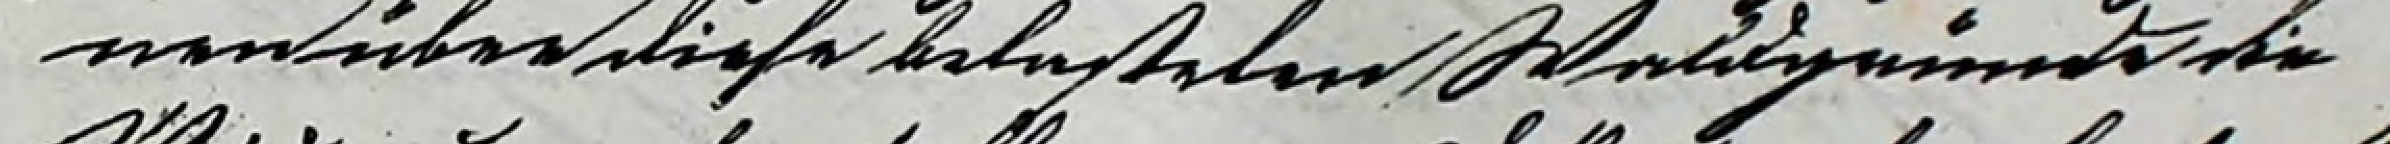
nen über diese belasteben Waldgründe die
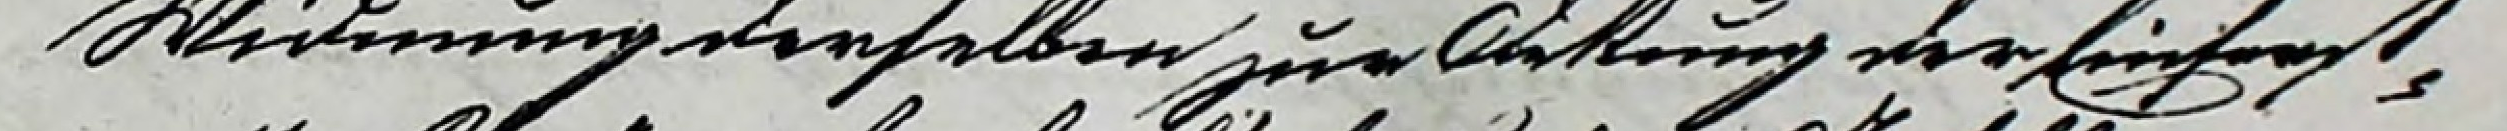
Widmung derselben zur Jekung der Einfrost„
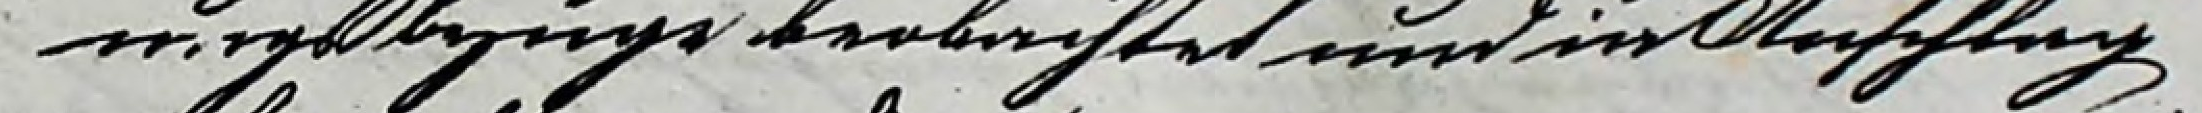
ungsbezüge bertachtet und in Anschlag
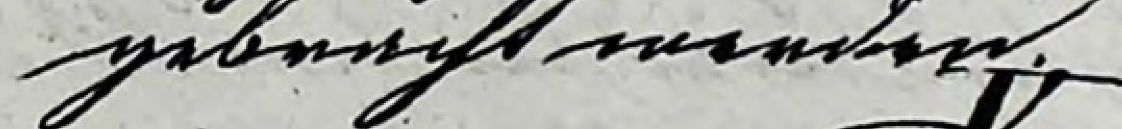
gebracht werden.
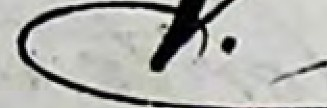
V.
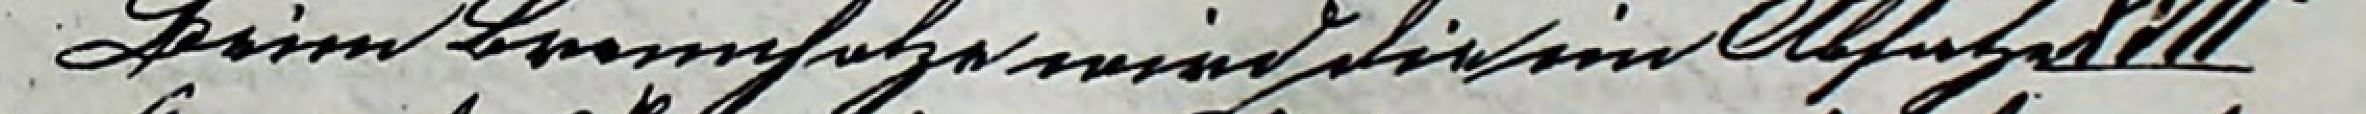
Beim Brennholze die ein Absatze XVII
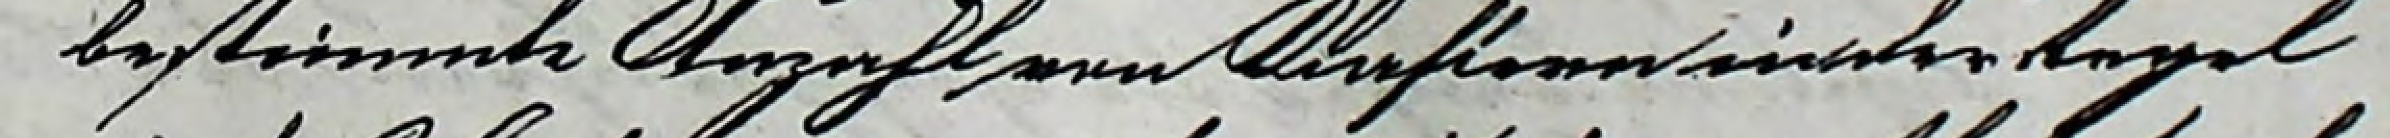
bestimmte Anzahl von Klafterinnder Drezel
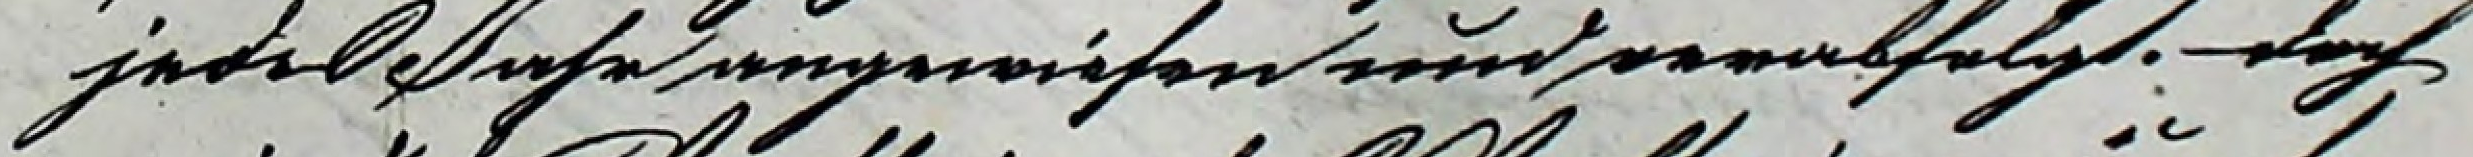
jedes Jahr angewiesen und verabfolgt. dach
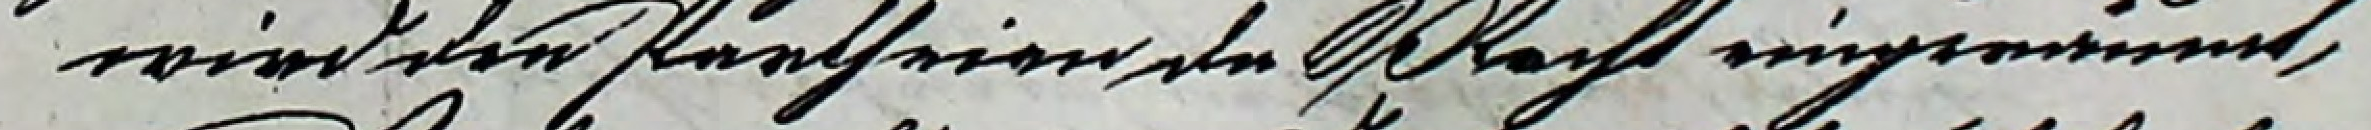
wird den Partheien den S, Recht eingeräumt,
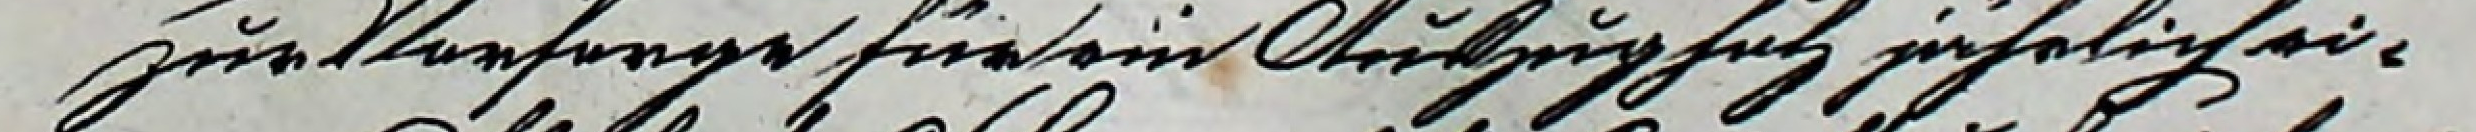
zur Vorsorge für ein Auszugholz jährlich ei„
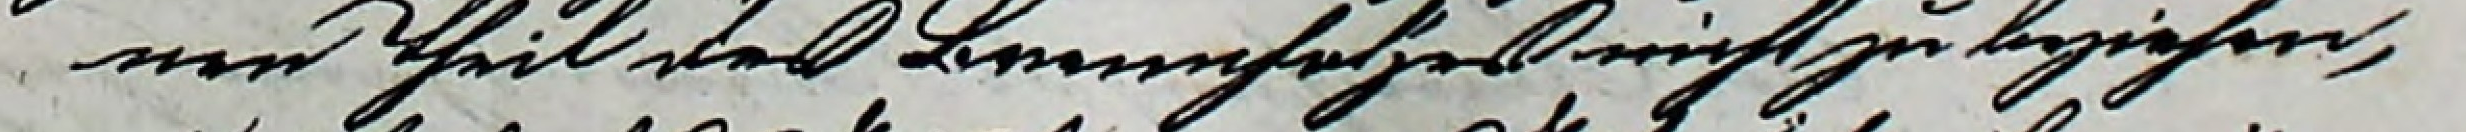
nen Theil des Brennholzes nicht zu beziehen,
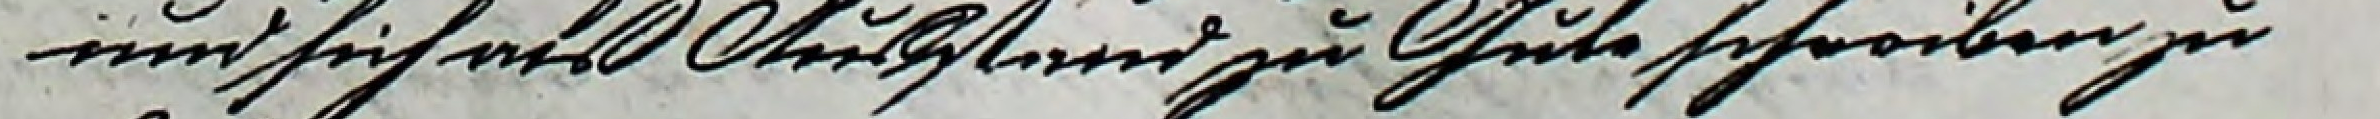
und sich als Ausstand zu Gute schreiben zu
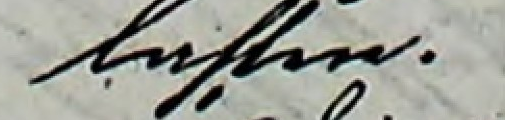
lasten.
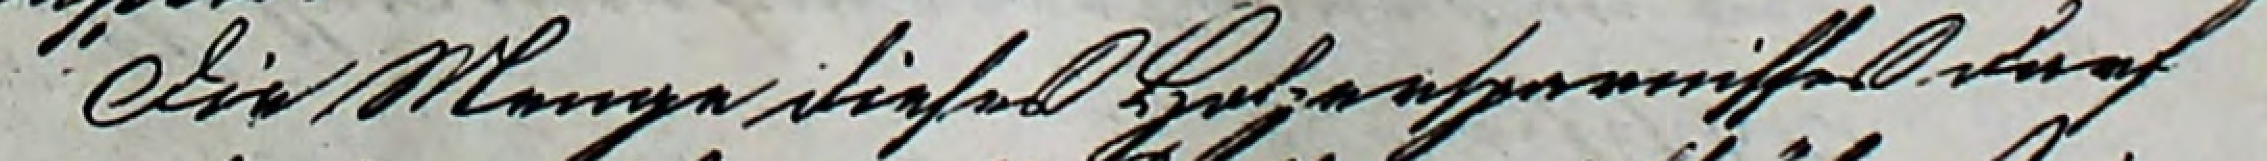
Die Menge dieses Holzersparnisses darf
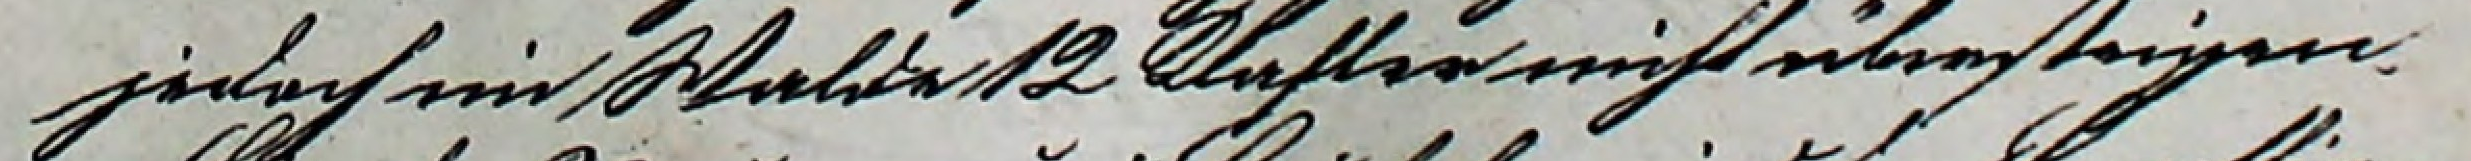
jedoch im Walde 12 Klafter nicht übersteigen
